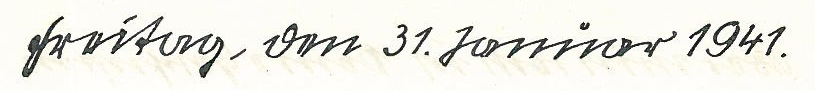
Freitag, den 31 Januar 1941.
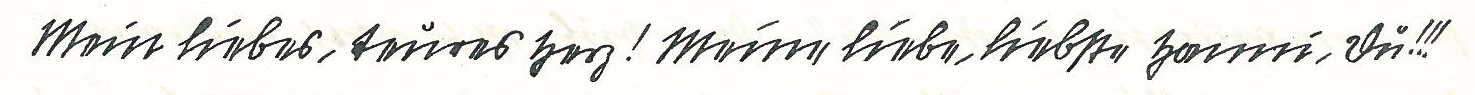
Mein liebes, teures Herz! Meine liebe, liebste Du!!!
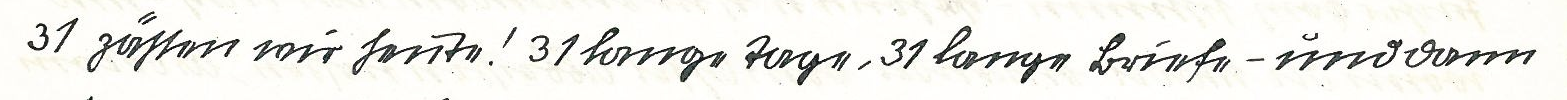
31 zählen wir heute! 31 lange Tage, 31 lange Briefe –
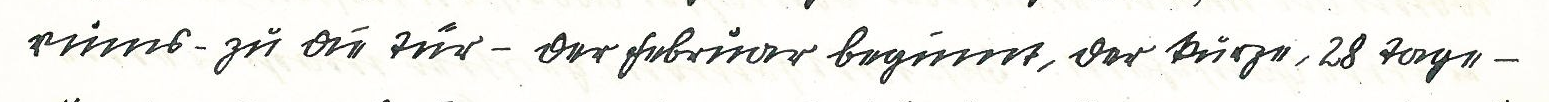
rums – zu die Tür – der Februar beginnt, der kurze, 28 Tage –
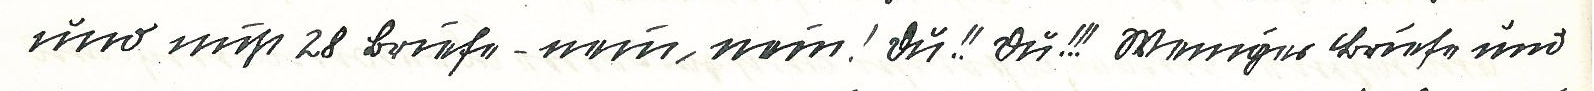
und nicht 28 Briefe – nein, nein! Du!!! Weniger Briefe und
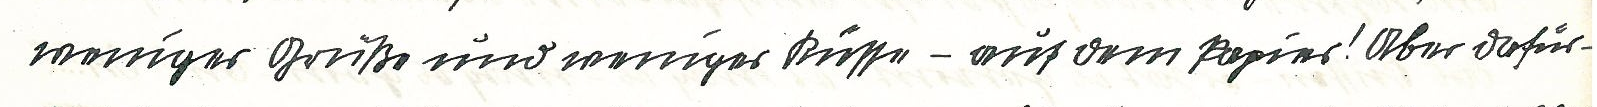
weniger Grüße und weniger Küsse – auf dem Papier! Aber dafür –
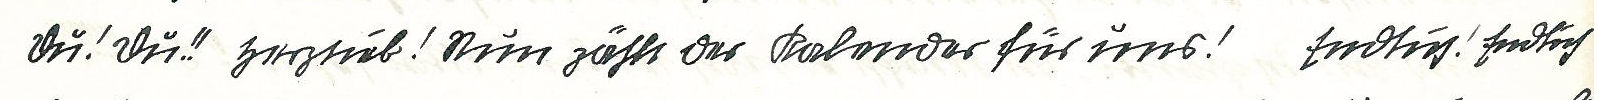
Du! Du!! Herzlieb! Nun zählt der Kalender für uns! Endlich! Endlich
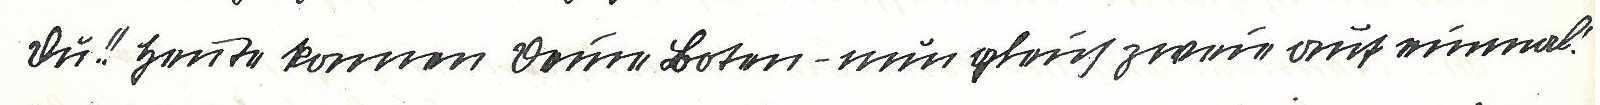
Du!! Heute kommen Deine Boten – nun gleich zwei auf einmal!
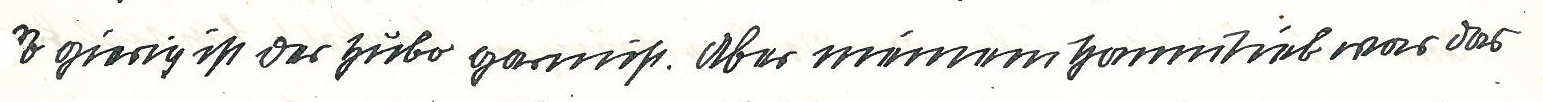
o gierig ist der Hubo garnicht. Aber meinem lieb war das
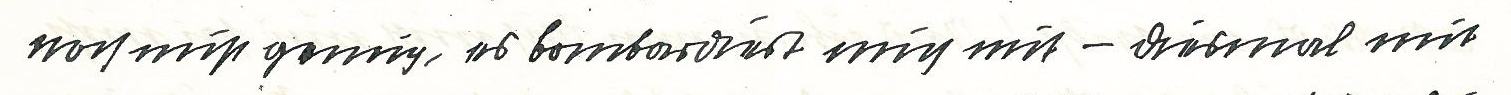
noch nicht genug, es bombardiert mich mit – diesmal mit
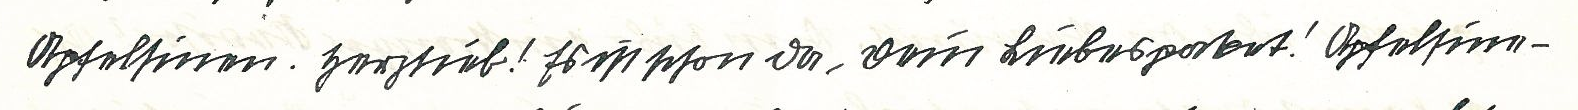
Apfelsinen. Herzlieb! Es ist schon da, Dein Liebespaket! Apfelsine –
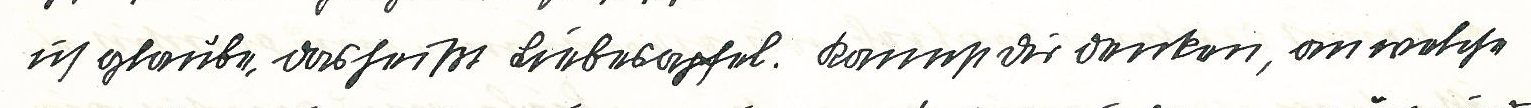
ich glaube, das heißt Liebesapfel. Kannst Dir denken, an welche
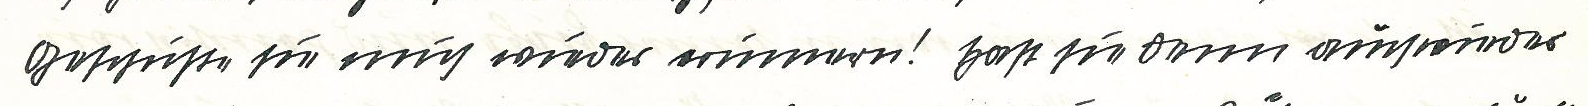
Geschichte sie mich wieder erinnern! Hast sie denn auch wieder
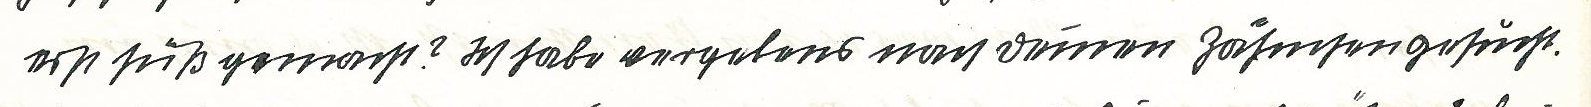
erst süß gemacht? Ich habe vergebens nach Deinen Zähnchen gesucht,
